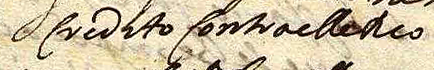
Credito Contra elle Reo
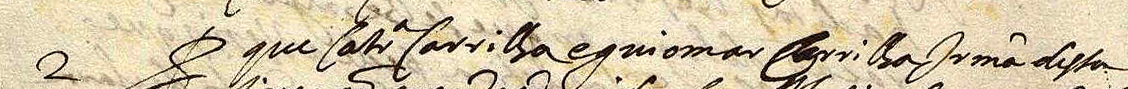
2 ꝓ que Catra Carrilha e guiomar Carrilha Jrmā desta
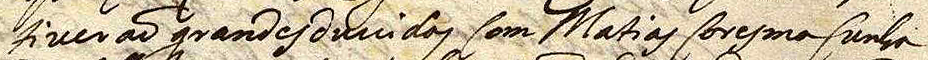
tiueraõ grandes duuidas Com Matias Coresma Cunha
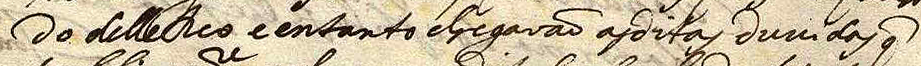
do delle Reo e entanto chegaraõ as ditas duuidas q̄
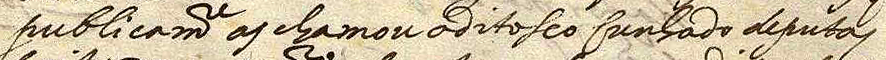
publicamte as chamou o dito seo Cunhado de putas
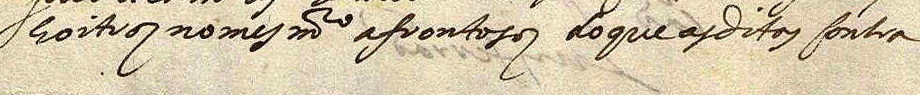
E oitros nomes mto afrontosos do que as ditas Contra
